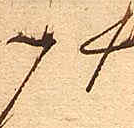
74
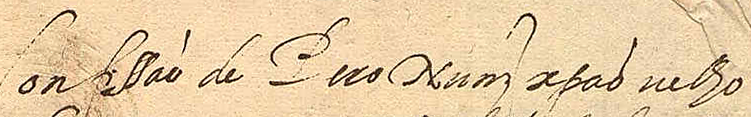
Confissaõ de Pero Nunz̄ xpaõ uelho
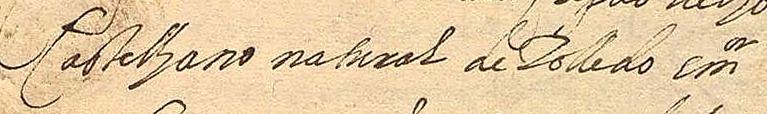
Castelhano natural de Tolledo E mor
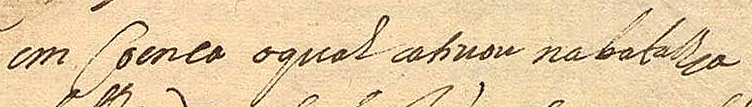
em Coenca o qual catiuou na batalha
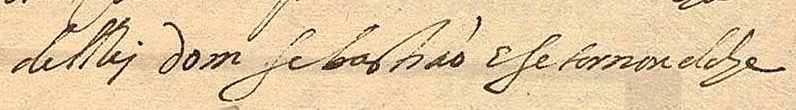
del Rej dom sebastiaõ E se tornou elche
